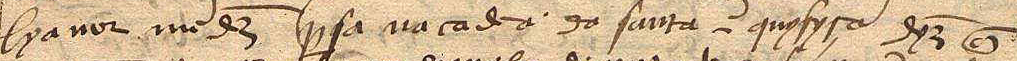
lyanor mēdez p̄sa na cadea da santa ēquysyçā dyz q̄
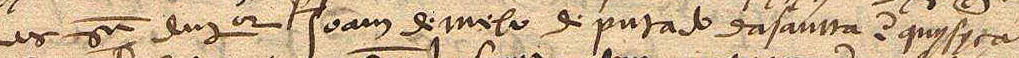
vos s̄or doutor Joam de melo deputado da samta ēquysyçā
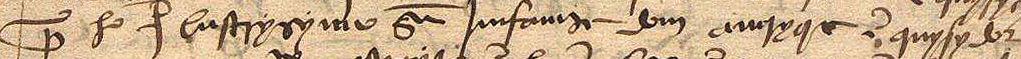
p̄o ho Jlustrysymo s̄or Jmfamte dom amryqe ēquysydor
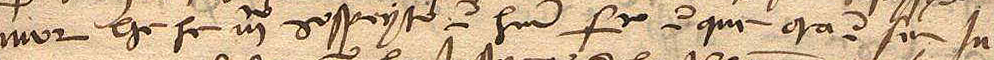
mor lhe he mto sospeyto ē hū fto ē que ora ē seu Ju
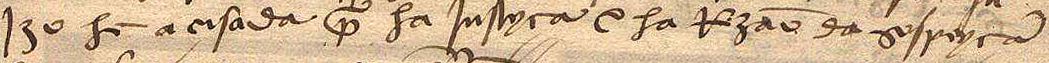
Jzo he acusada p̄o ha Justiça e ha Rezão da sospeyçā
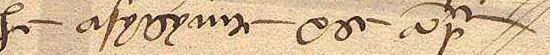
he a sygymte e se c̄opr //
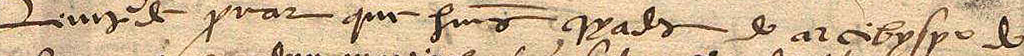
E emtēde ꝓuar que huūs cryados do arcebyspo do
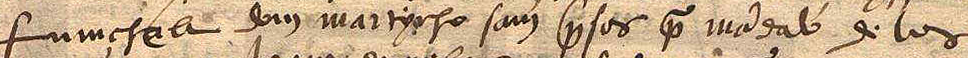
fumchall dom martynho sam p̄sos p̄o mādado de vos
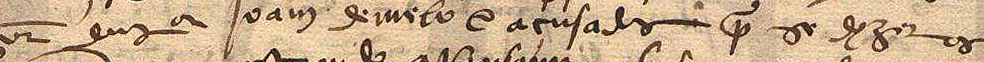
s̄or doutor Joam de melo e acusados p̄o se dyzer os
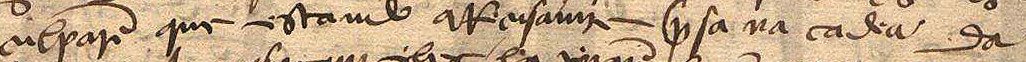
culparē que estamdo a Recusamte p̄sa na cadea da
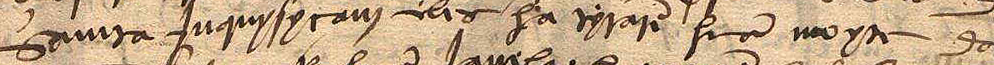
samta Jmquysyçam elles ha tyrarē huā noyte da
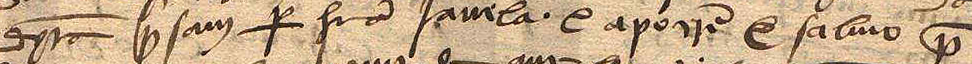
dyta p̄sam ꝑ huā Janela. e a poerē ē saluio p̄o
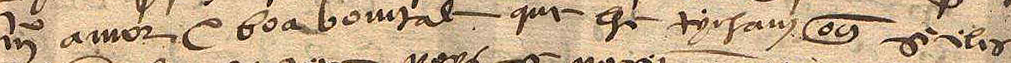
mto amor e boa vomtade que lhe tynham o q̄ se eles
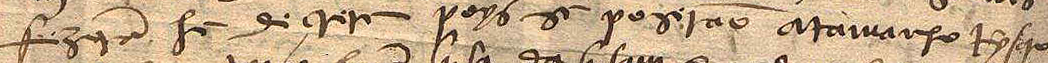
fezerā he de crere poys se poserão a tamanho Rysqo
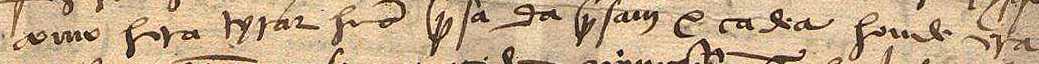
como era tyrar hūa p̄sa da p̄sam e cadea honde era
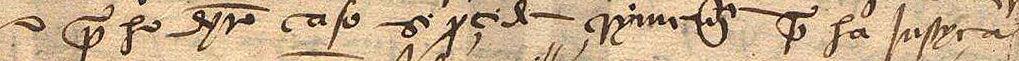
e p̄o ho dyto caso se ꝓçede çrymemte p̄o ha Justyçā
